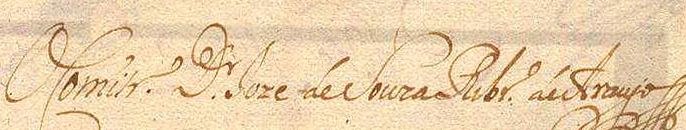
O Comīsr.o D.r Ioze de Souza Ribr.o de Araujo
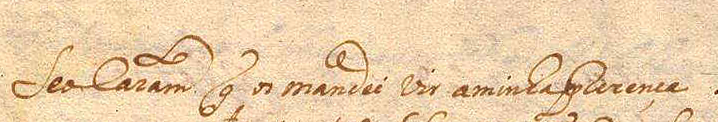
Seo Cazam.to q̄ os mandei vir a minha pRezença
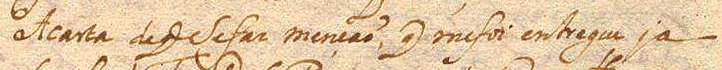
A carta de q̄ Se faz mençaõ, q̄ me foi entregue ja
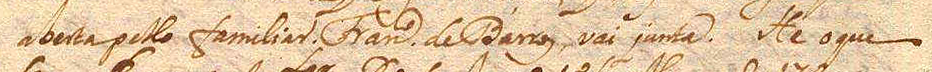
aberta pello familiar. Fran.co de Barros, vai junta. He o que
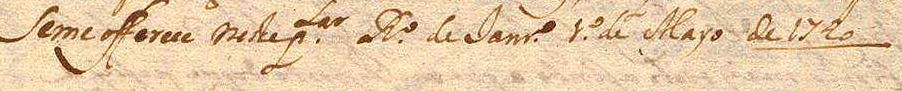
se me offerece neste p.lar R.o de Ianr.o 1.o de Mayo de 1740
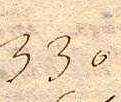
330
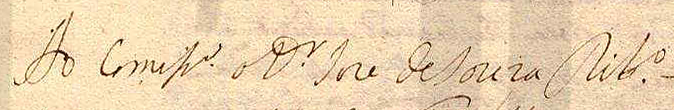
Ao Comisr.o o D.r Ioze de Souza Rib.o
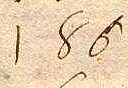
186
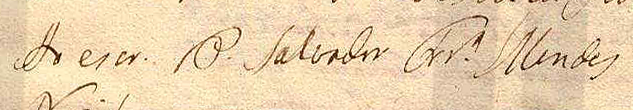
Ao escr. o P. Salvador Frr.a Mendes
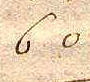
60
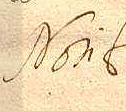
Notif
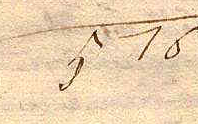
576
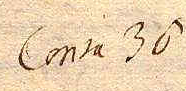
Conta 36
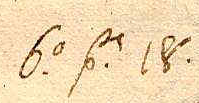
6.o p.te 18.
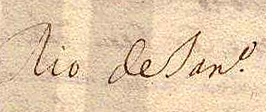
Rio de Ian.o
